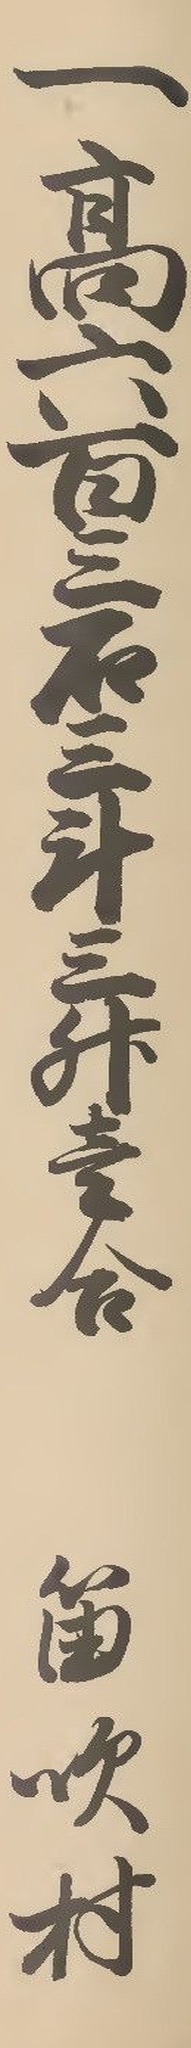一髙六百三石三斗三升壱合笛吹村
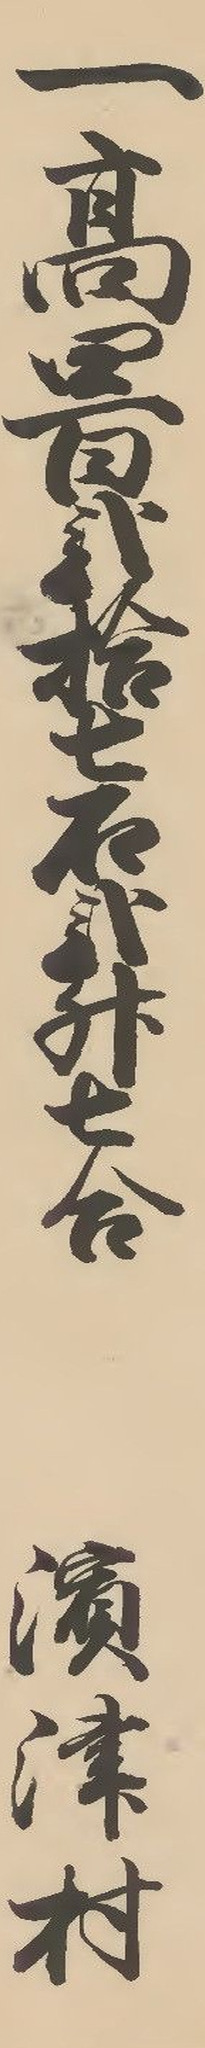一髙四百弐拾七石二升七合濱津村
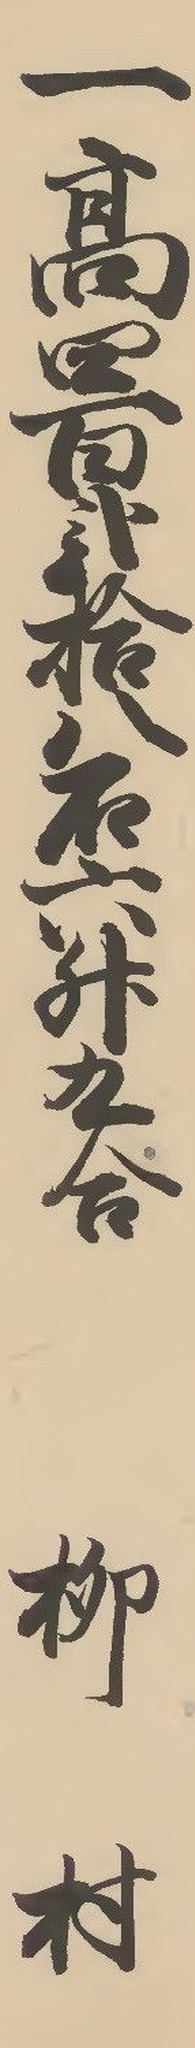一髙四百弐拾八石六升九合柳村
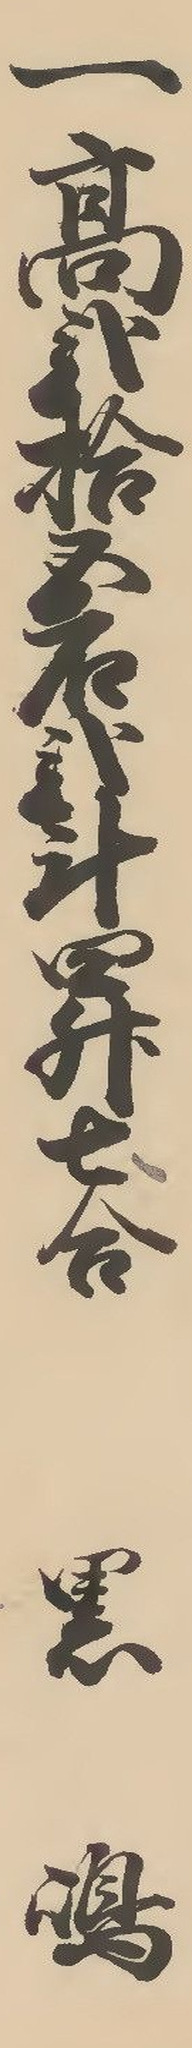一髙弐拾五石弐斗四升七合黑嶋

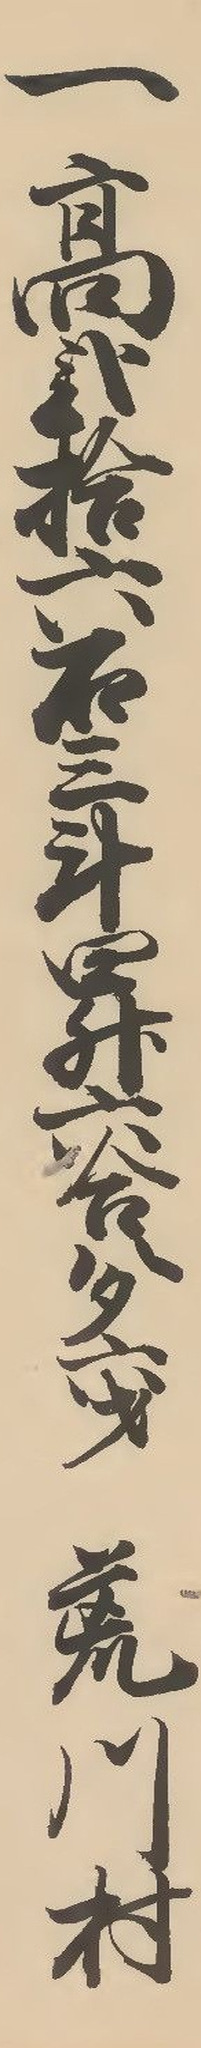一髙弐拾六石三斗四升六合八夕六才荒川村
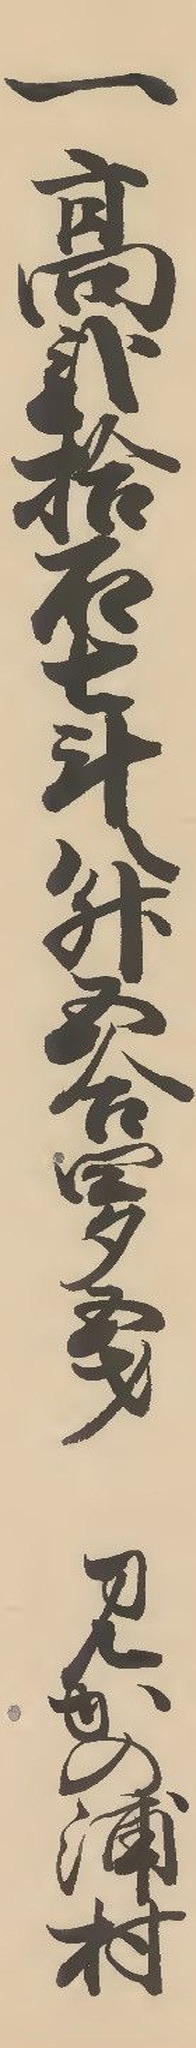一髙弐拾石七斗八升五合四夕五才見かの浦村
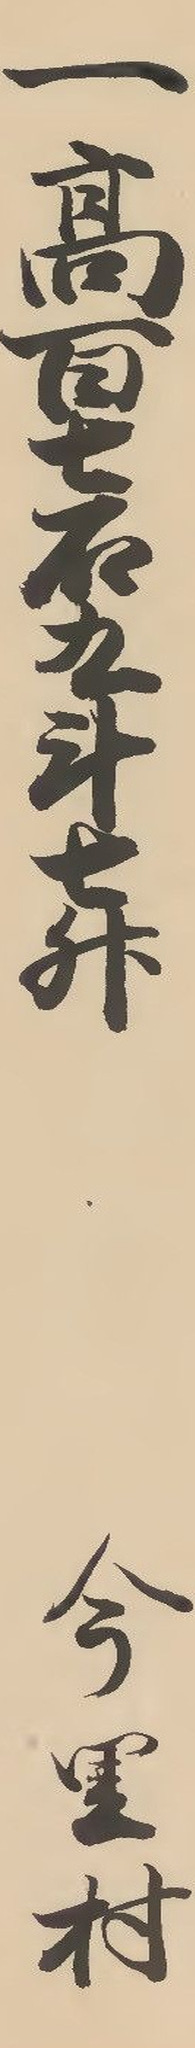一髙百七石九斗七升今里村
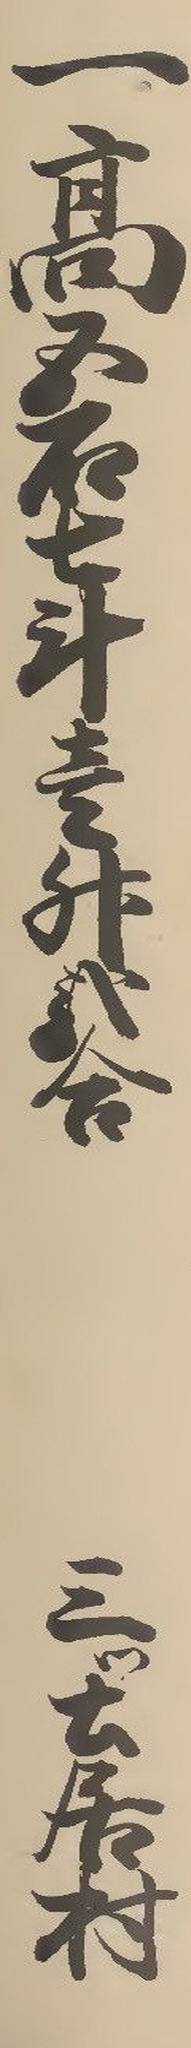一髙五石七斗壱升弐合三つ土居村
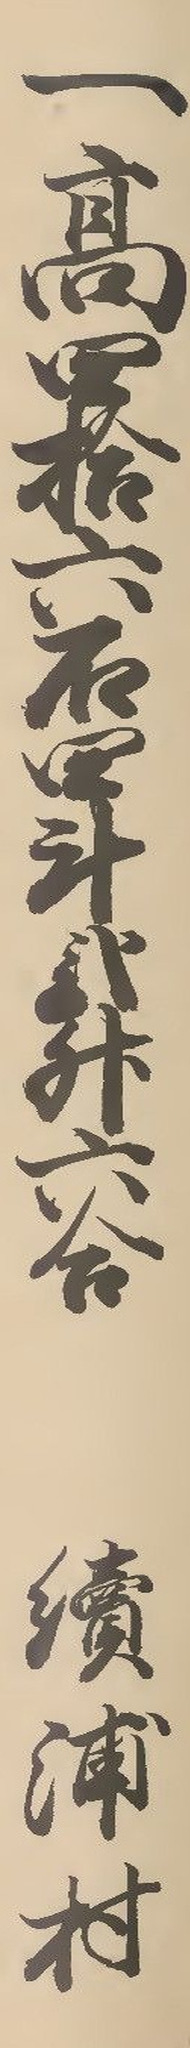一髙四拾六石四斗弐升六合続浦村
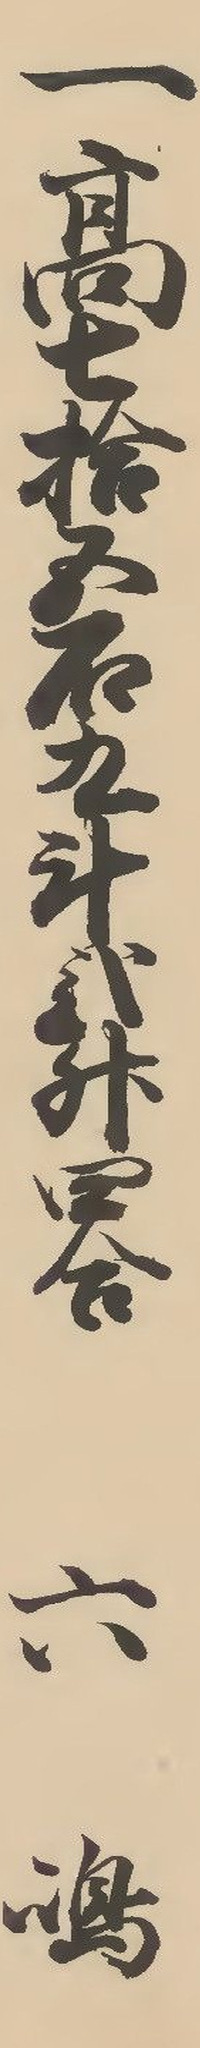一髙七拾五石九斗弐升四合六嶋
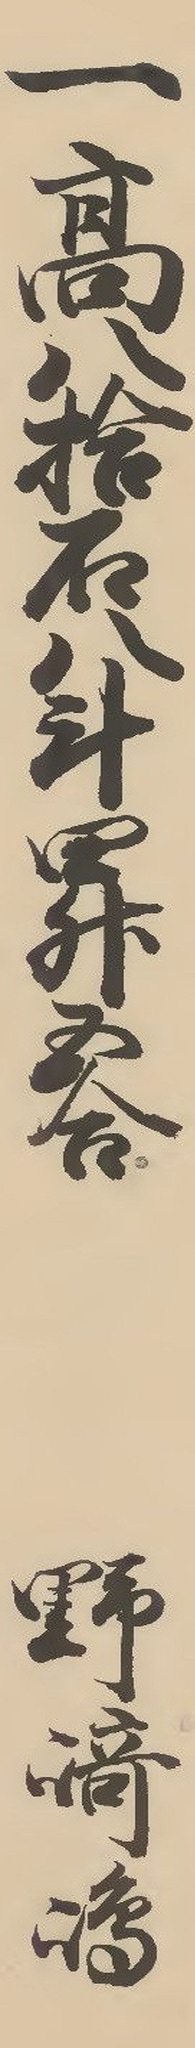一髙八拾石八斗四升五合野崎嶋

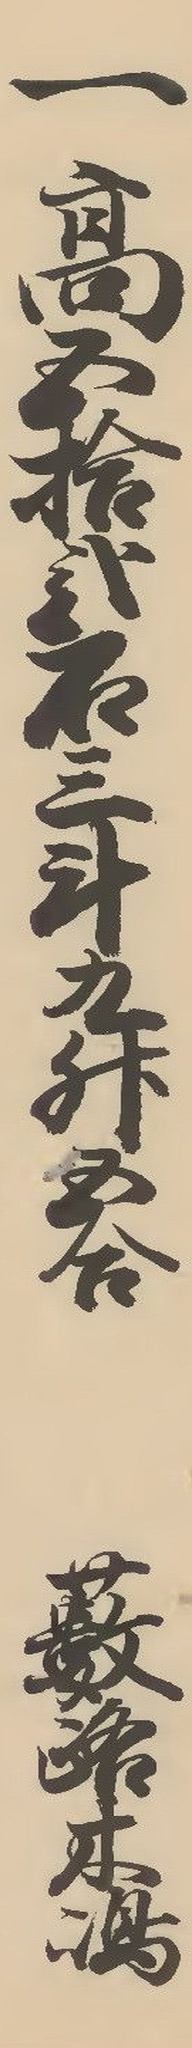一髙五拾弐石三斗九升五合藪路木嶋
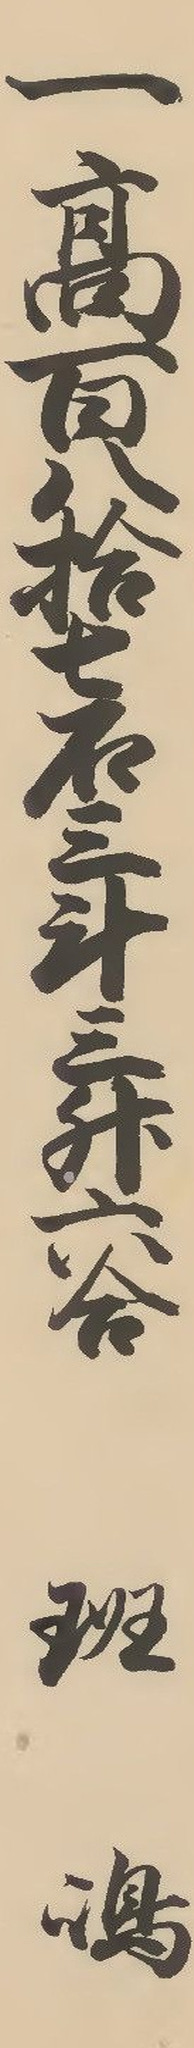一髙百八拾七石三斗三升六合斑嶋
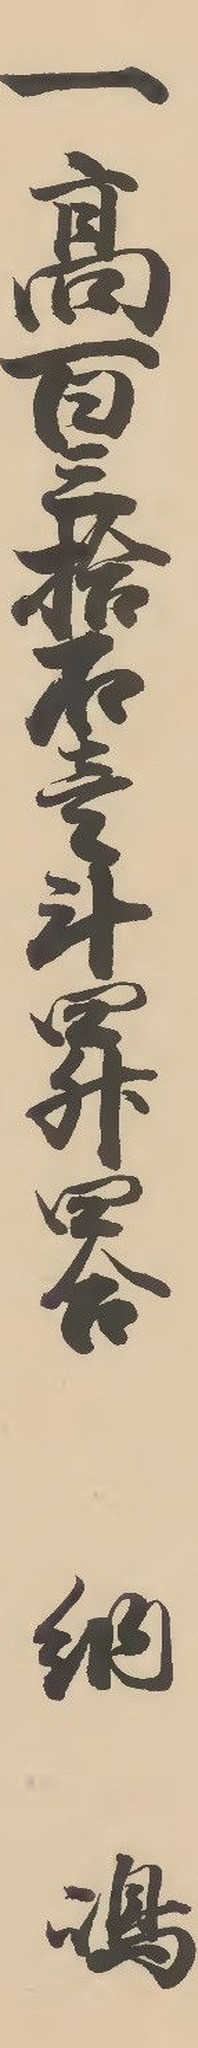一髙百三拾石壱斗四升四合納嶋
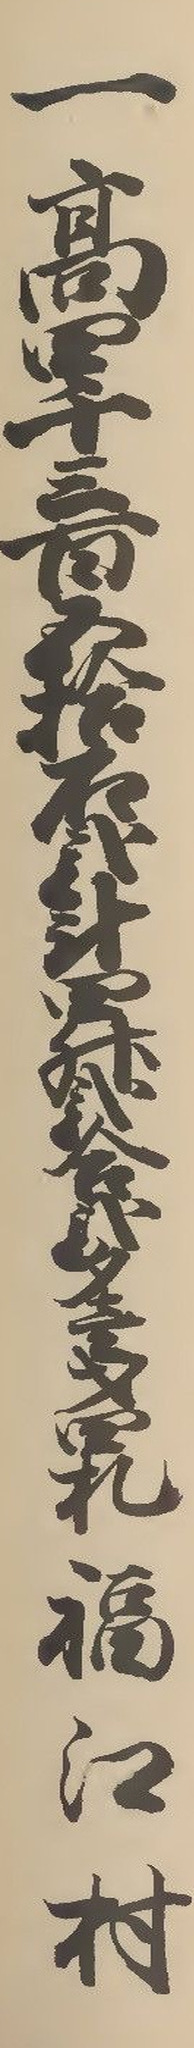一髙四千三百五拾石弐斗四升弐合弐夕壱才四札
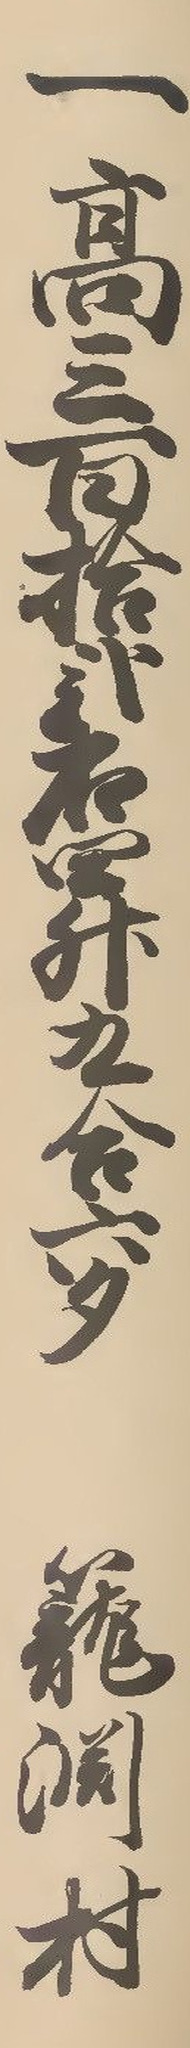一髙三百拾弐石四斗九合六夕籠淵村
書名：肥前国郷帳
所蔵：国立公文書館 National Archives of Japan
